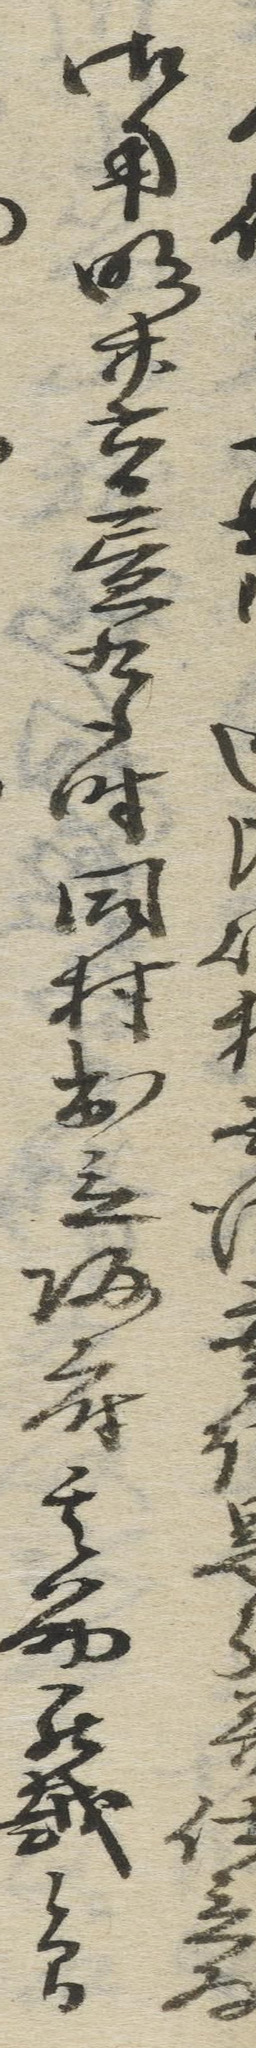御用明廿六日昼九ッ時同村出立帰府其筋罷越候間
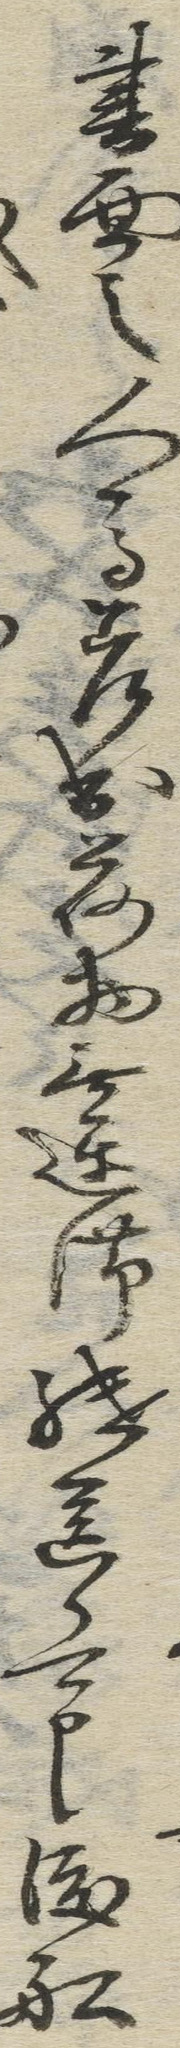書面之人馬差出荷物無遅滞継送り可申渡船
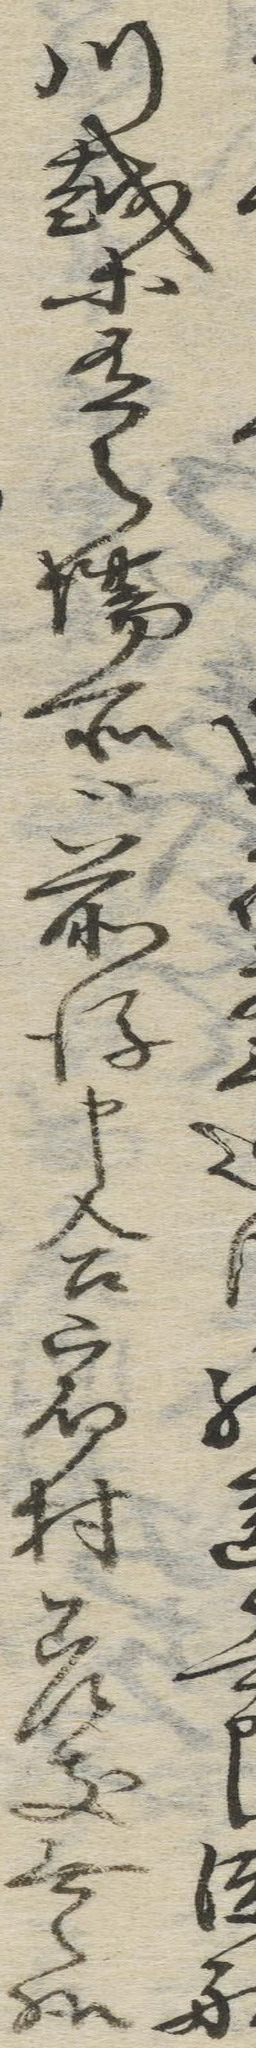川越等有之場所ハ前後申合宿村差支無之様
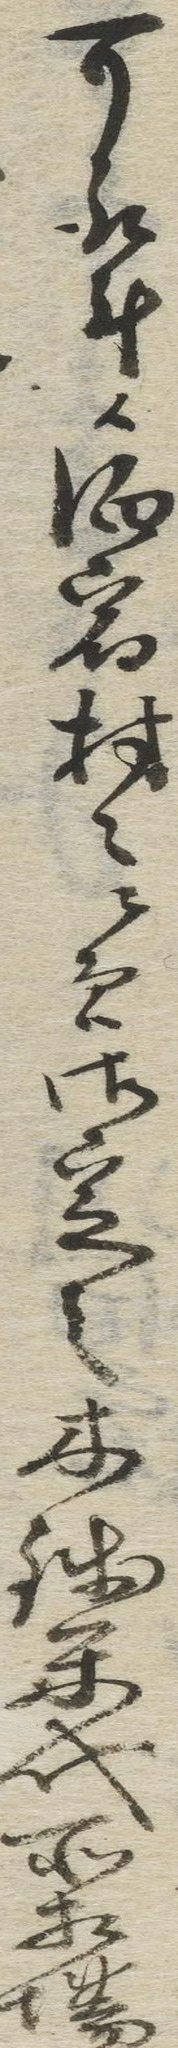可取計候泊宿村々二而ハ御定之木銭米代所相場
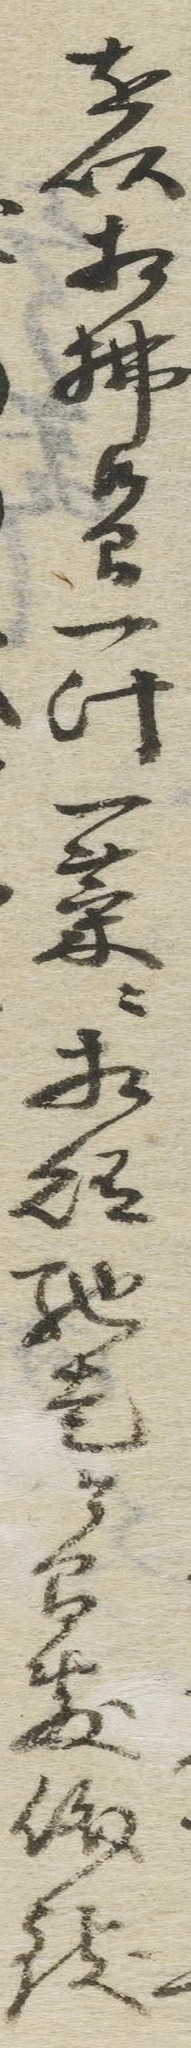を以相払候間一汁一菜二相賄馳走ヶ間敷致
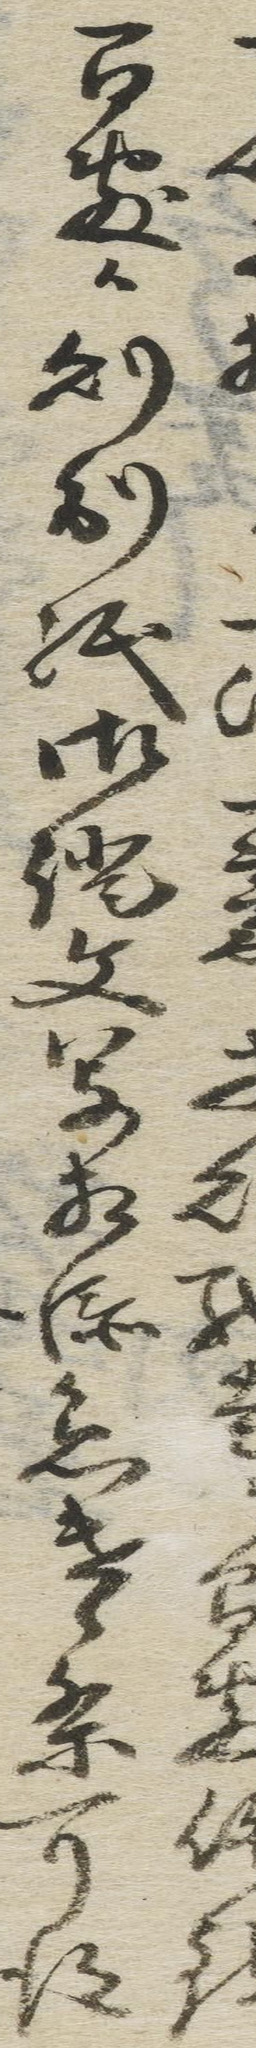間敷候則別紙御證文写相添急遣候条可得
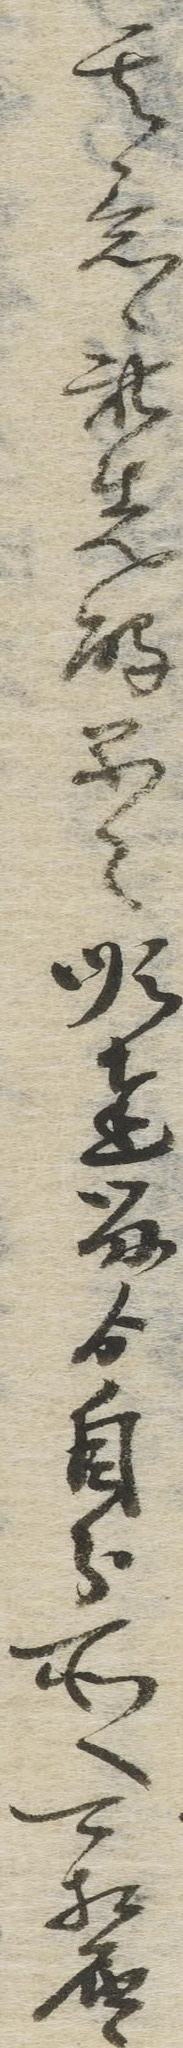其意候此先触早々順達留ゟ自分所へ可相届候以上
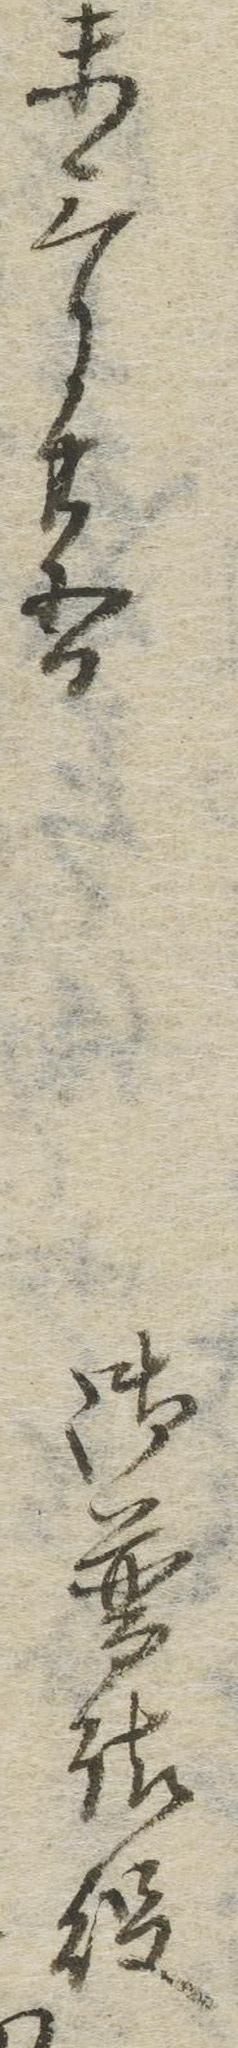未三月廿五日御普請役
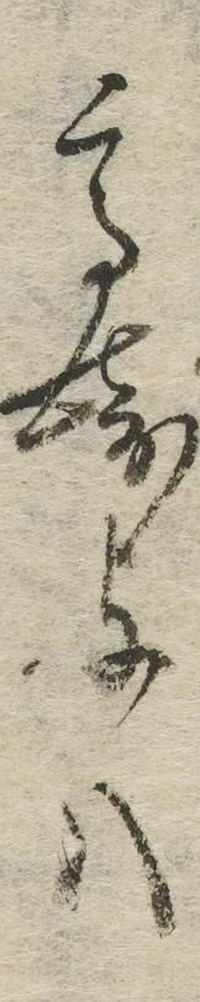高崎与八
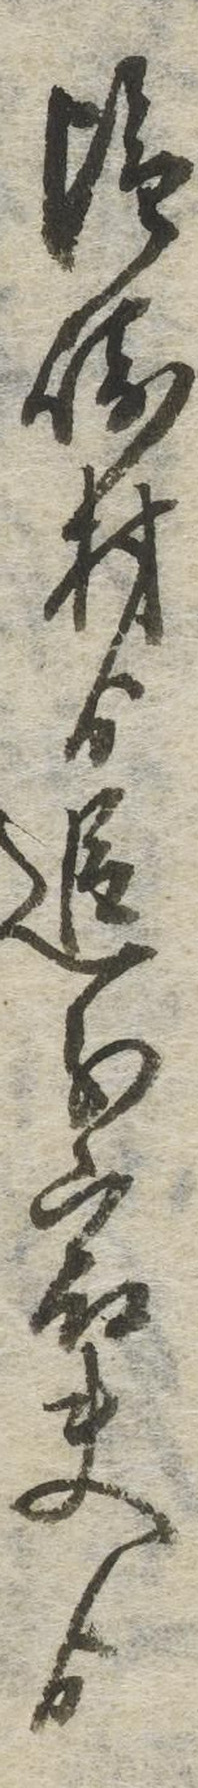塩崎村ゟ追分宿夫ゟ
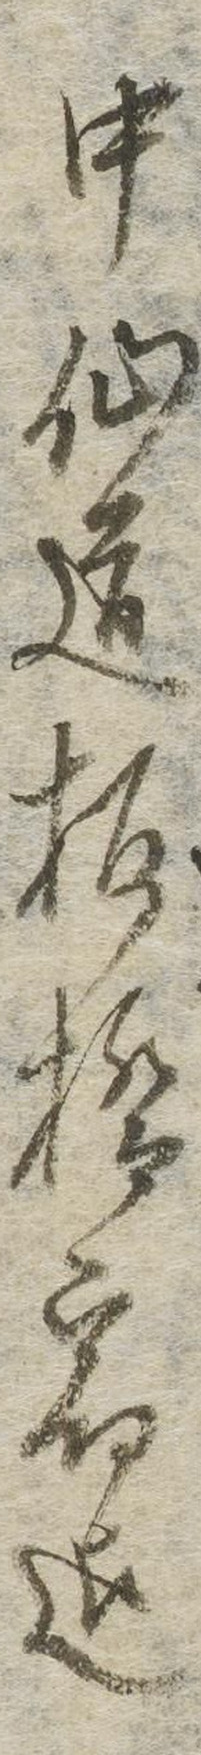中仙道板橋宿迄
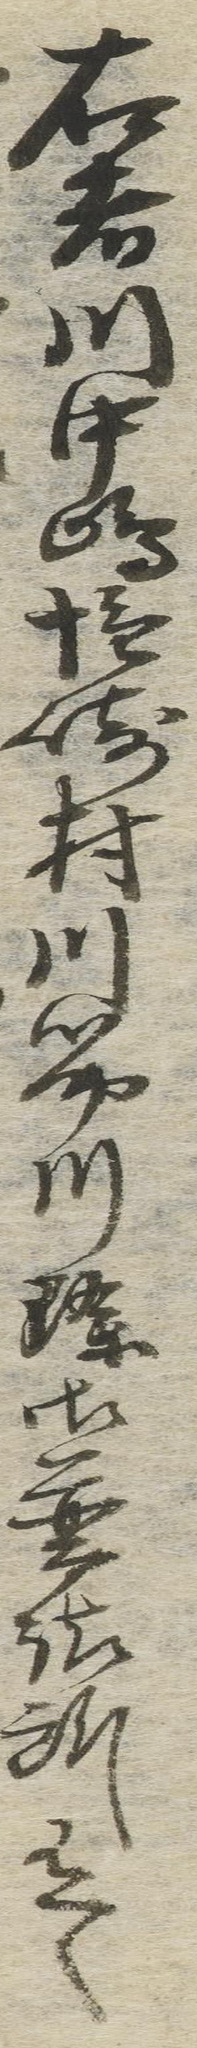右は川中嶋塩崎村川筋川除御普請所有之
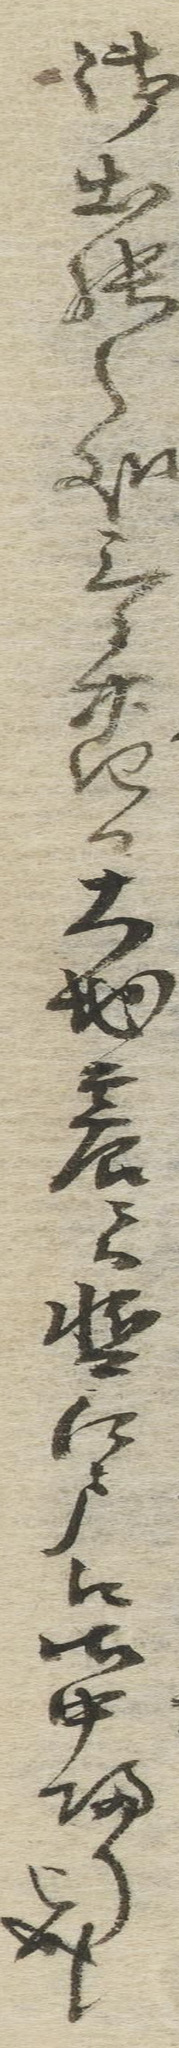詰出張之処三月廿四日大地震二而暫江戸江御中帰り被成候

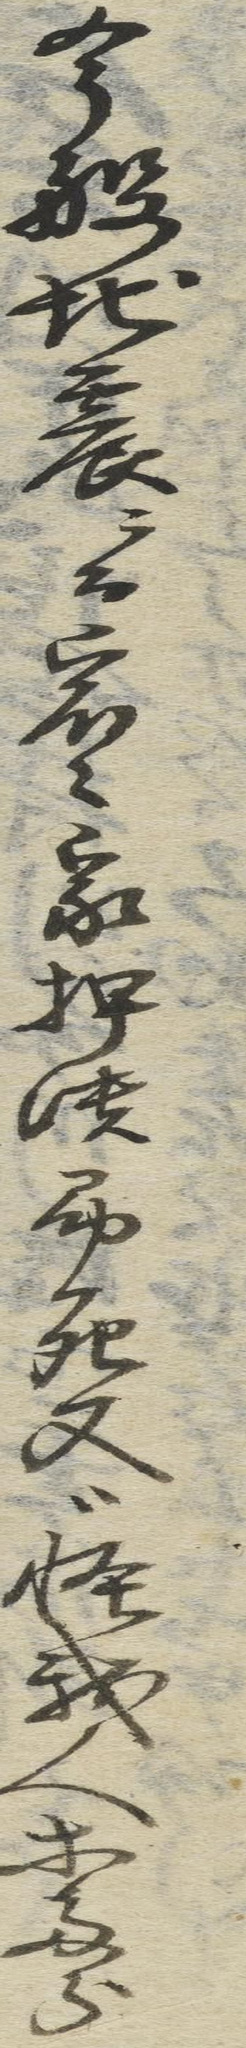今般地震二而宿々家押潰即死又ハ怪我人等多分
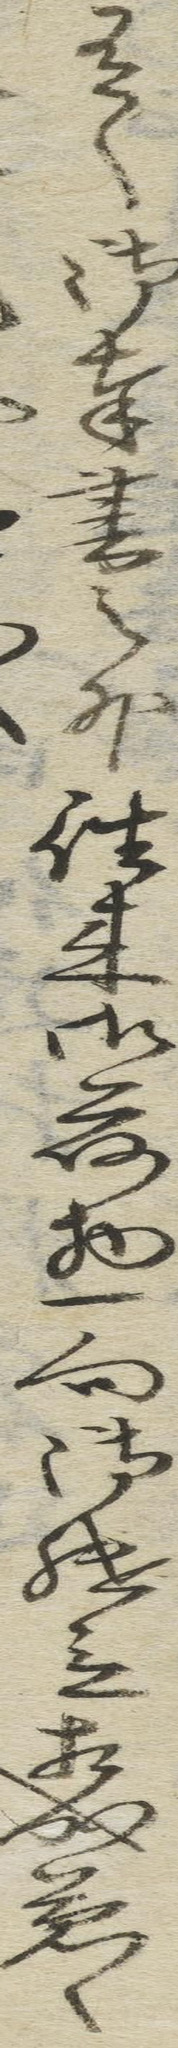有之御奉書之外往来御荷物一向御継立相成兼候
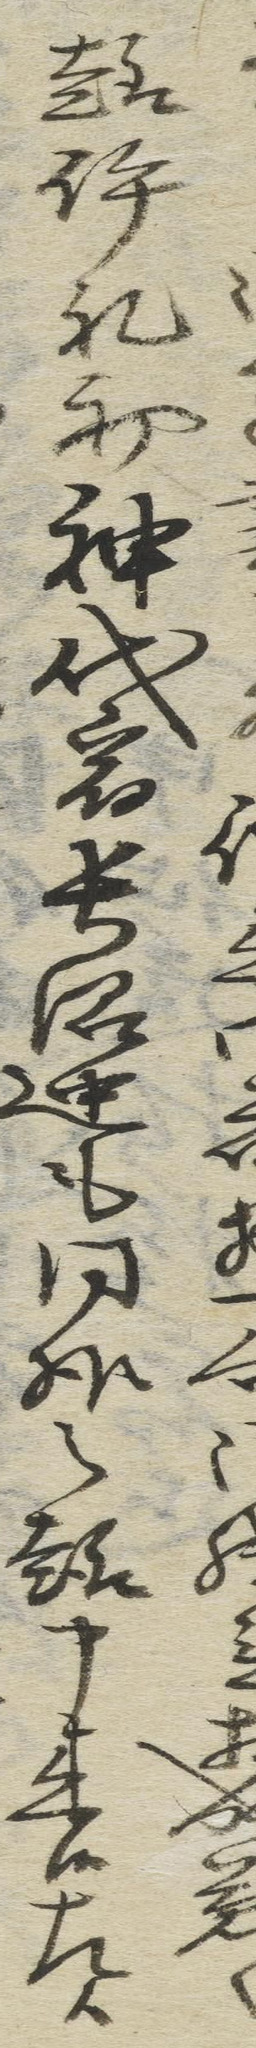趣侔礼初神代宿長沼迚も同様之趣申来候左候
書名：信濃越後　地震書留
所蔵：東京大学地震研究所図書室 Earthquake Research Institute Library, The University of Tokyo, JAPAN
